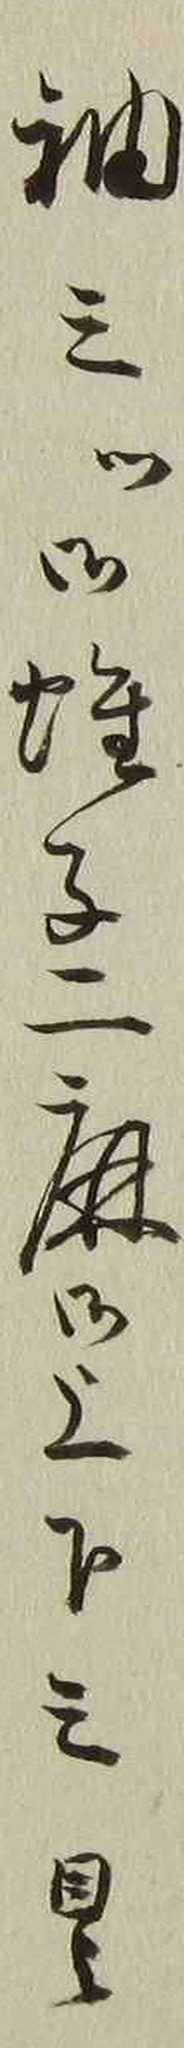袖三ツ御帷子二麻御上下三具
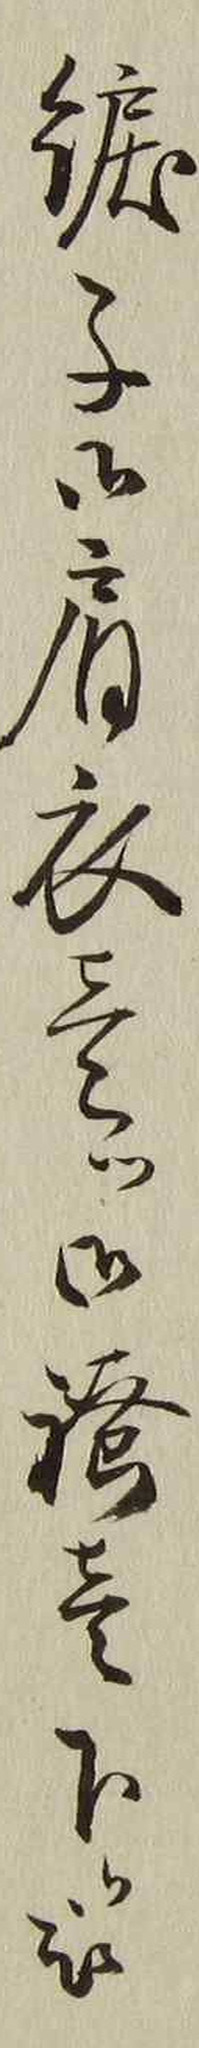綟子御肩衣壱ツ御袴壱下り被
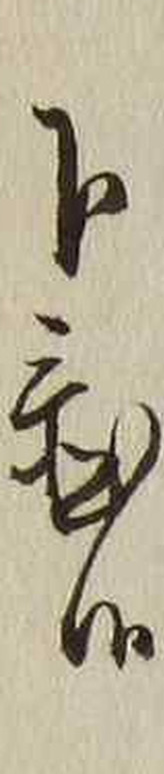下置候
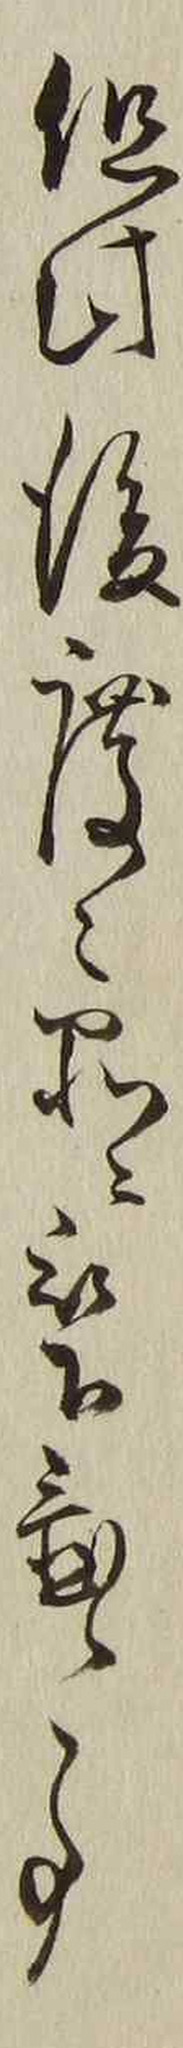但此後度々品々被下置候事
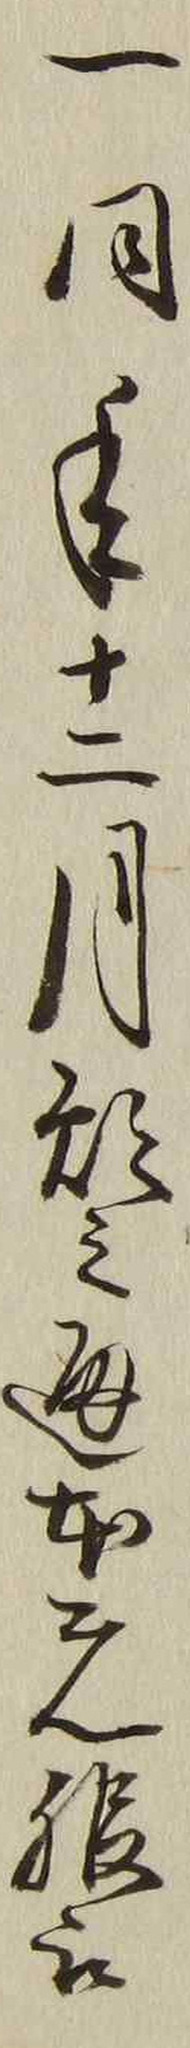一同年十二月願之通本元服被

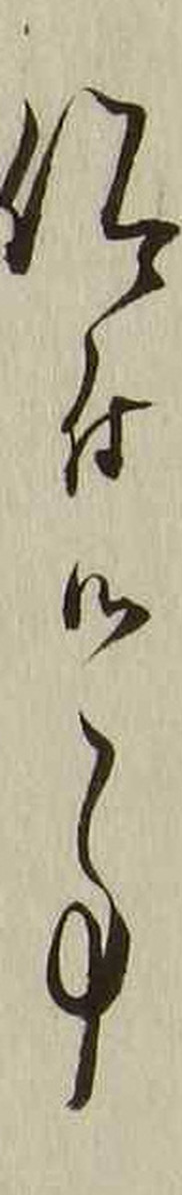仰付候事
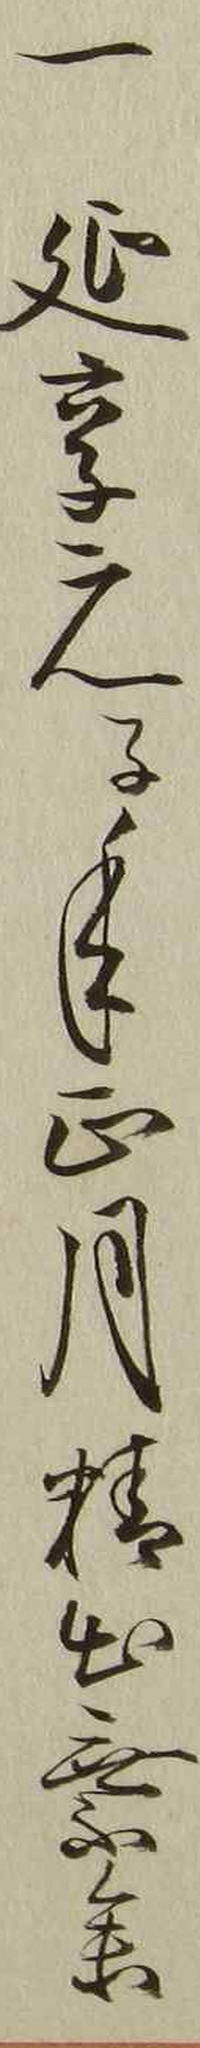一延享元子年正月精出無不参
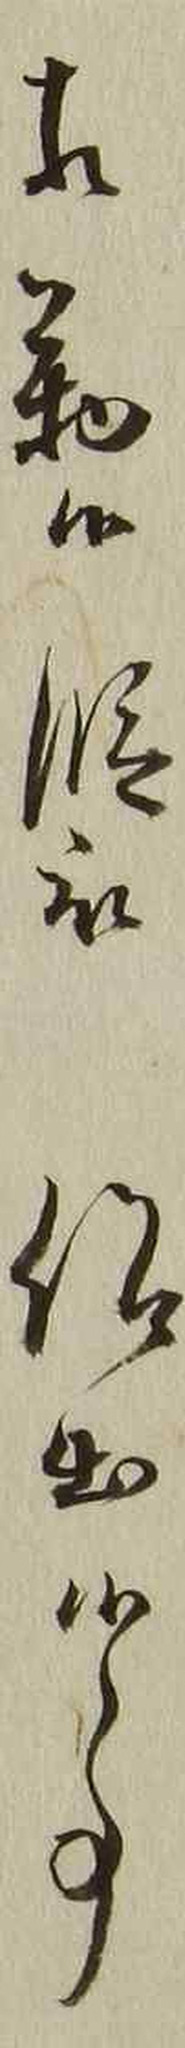相勤候段被仰出候事
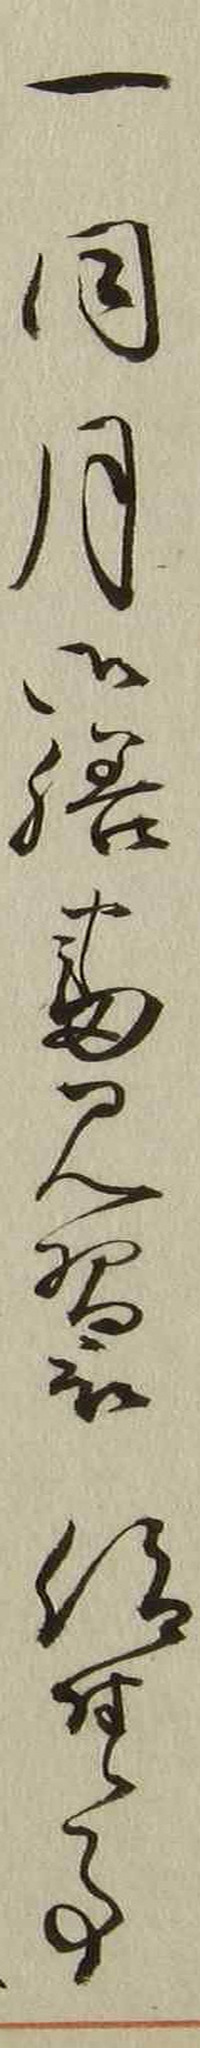一同月御膳番見習被仰付候事
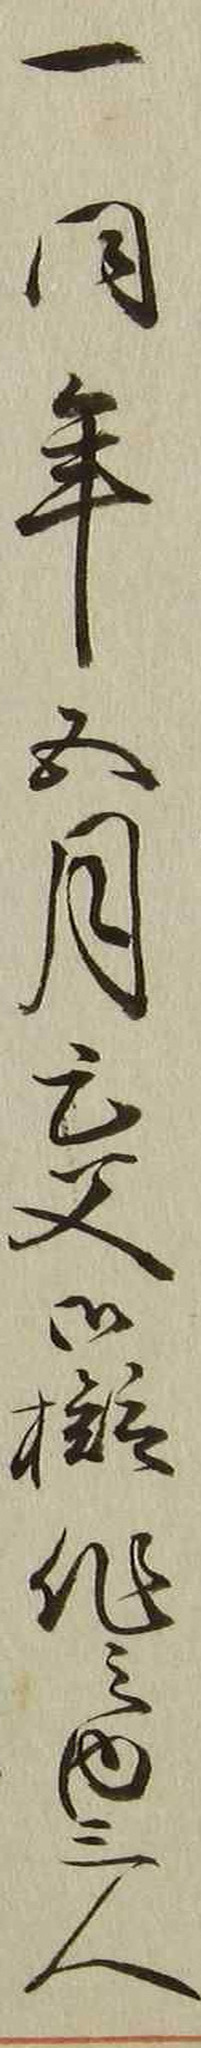一同年五月亡父御擬作之内三人
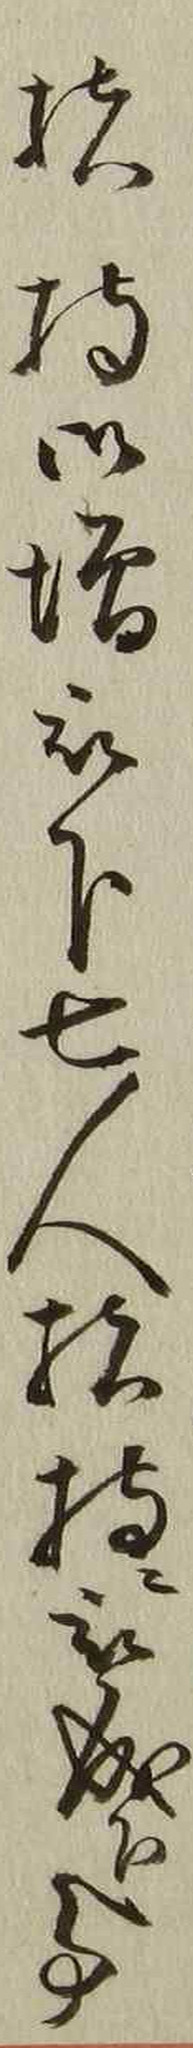扶持御増被下七人扶持ニ被成下候事
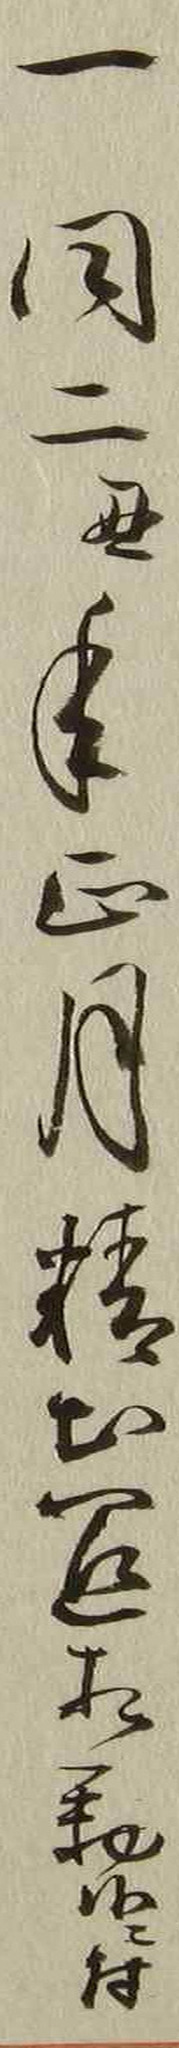一同二丑年正月精出宜相勤候ニ付
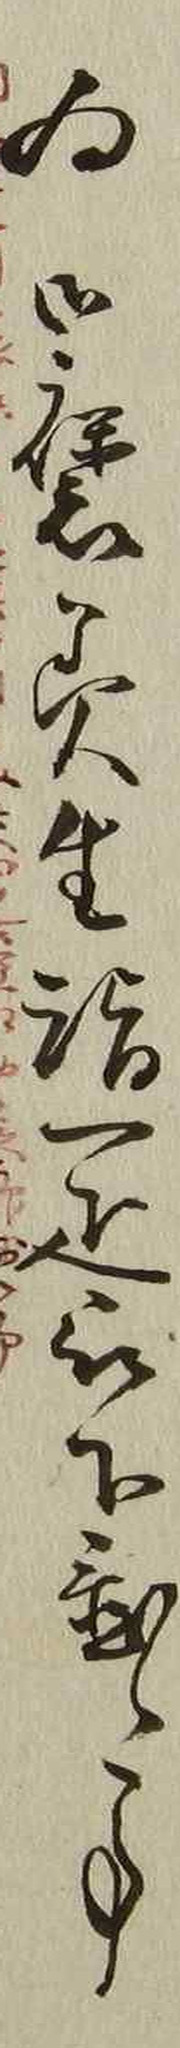為御褒美生絹一疋被下置候事
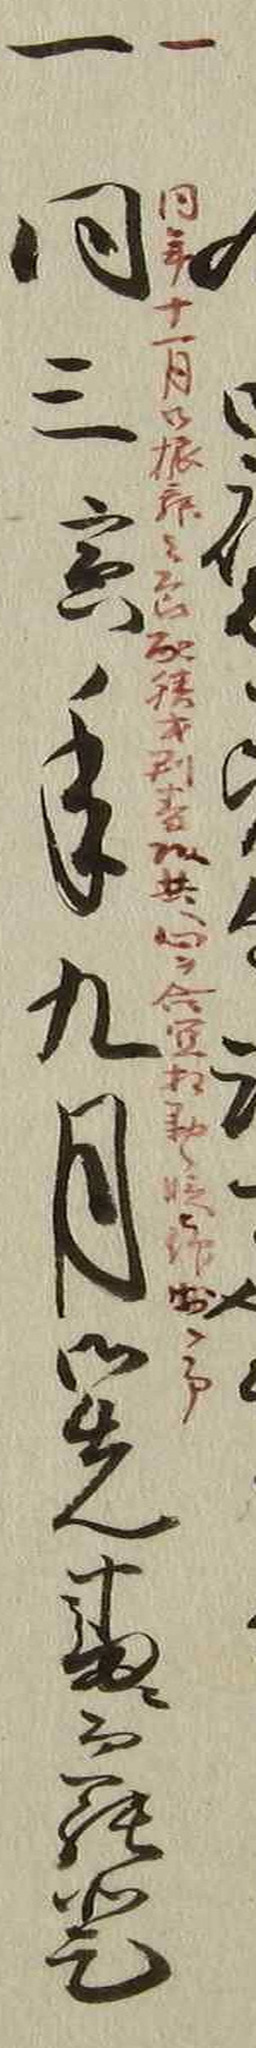一同三寅年九月御先番ニ而罷登
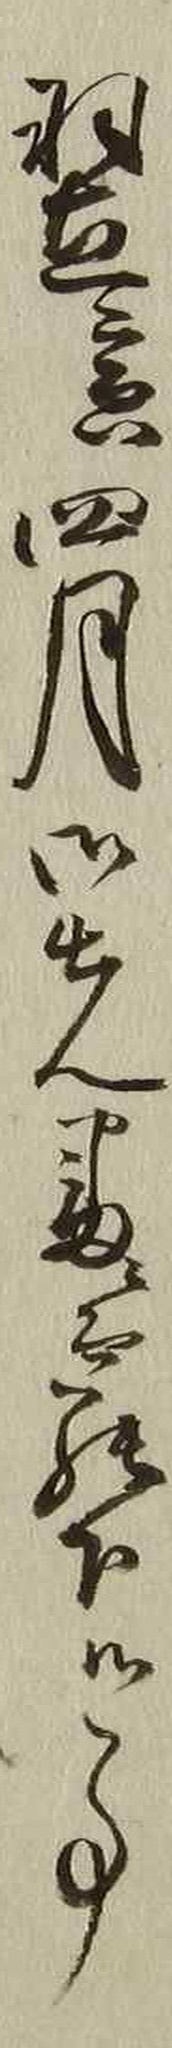翌寅四月御先番ニ而罷下候事
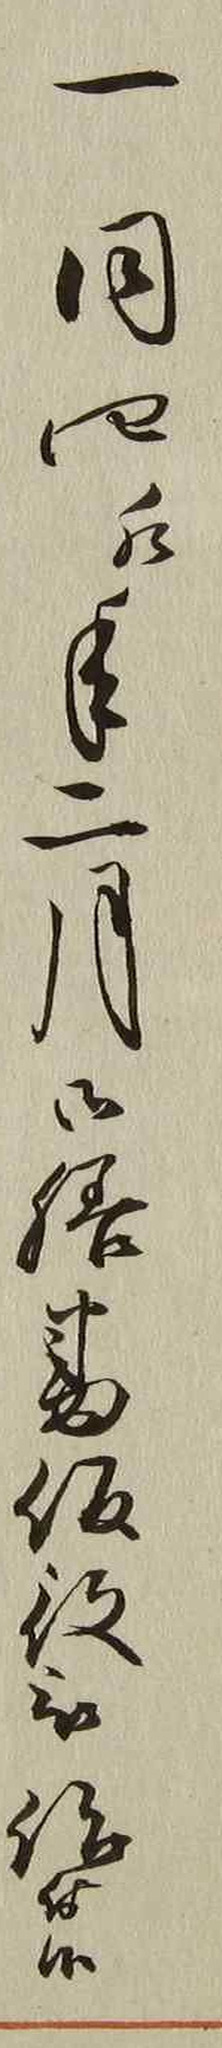一同四卯年二月御膳番仮役被仰付候
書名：諸士系譜　巻之57　ほ之部4
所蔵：会津若松市立会津図書館
